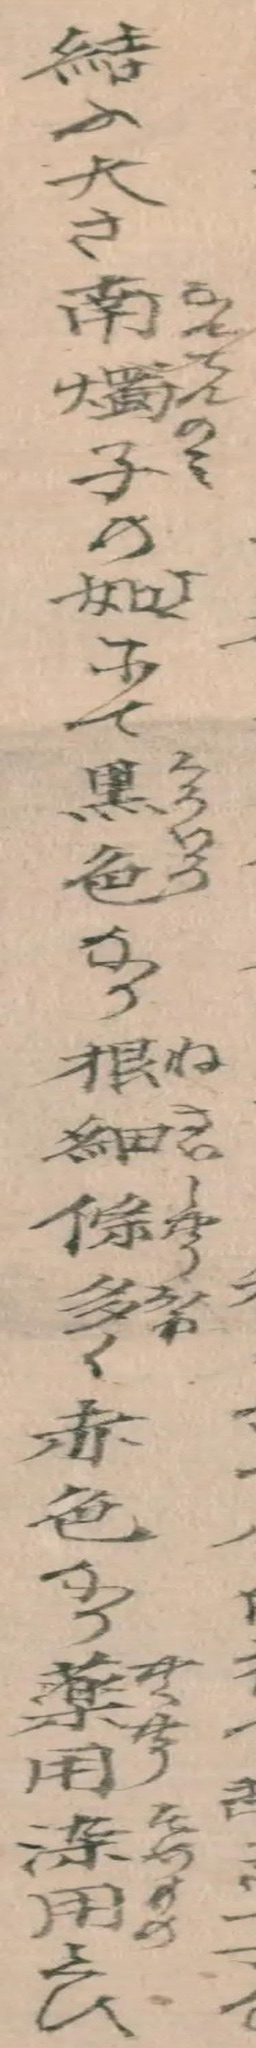結ふ大さ南燭子の如にて黒色なり根細条多く赤色なり薬用染用とす

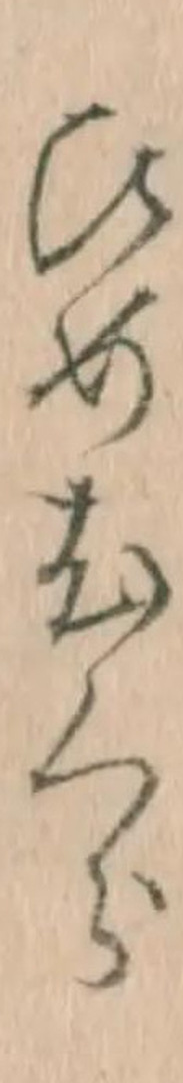ひめむくら
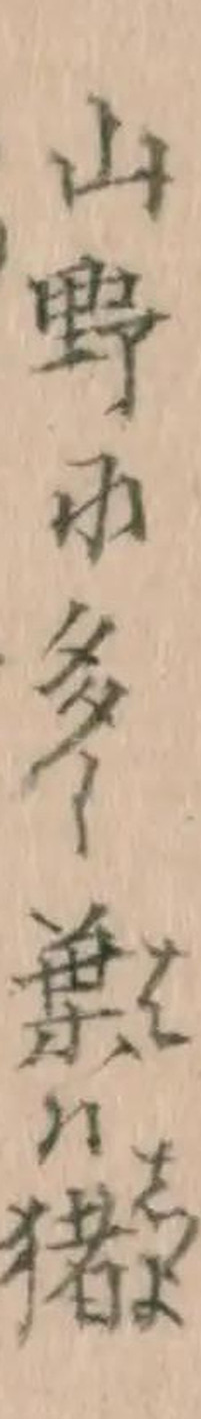山野に多し葉は猪
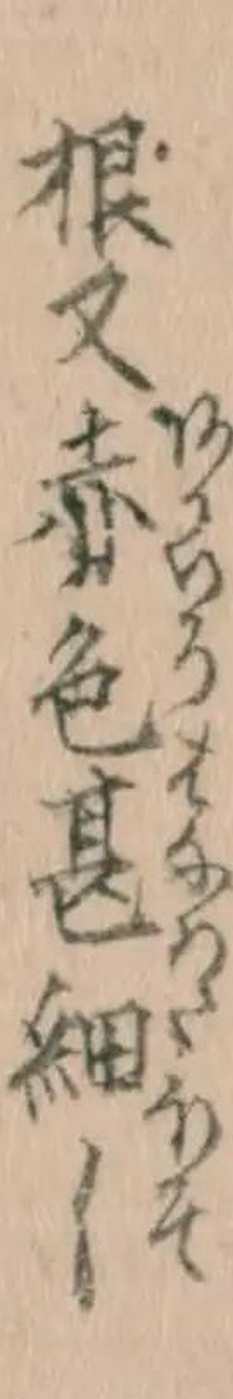根又赤色甚細し
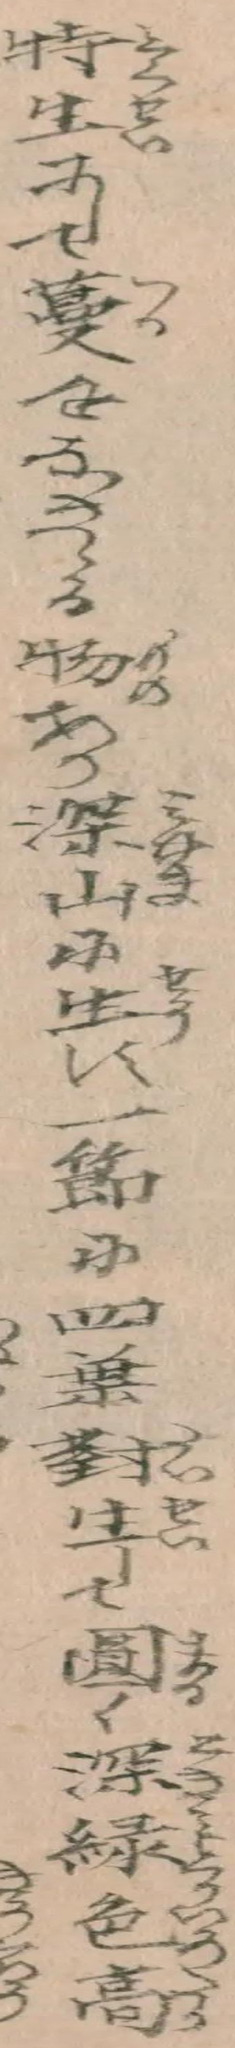特生にして蔓をなさゝる物あり深山に生す一節に四葉対生して円く深緑色高
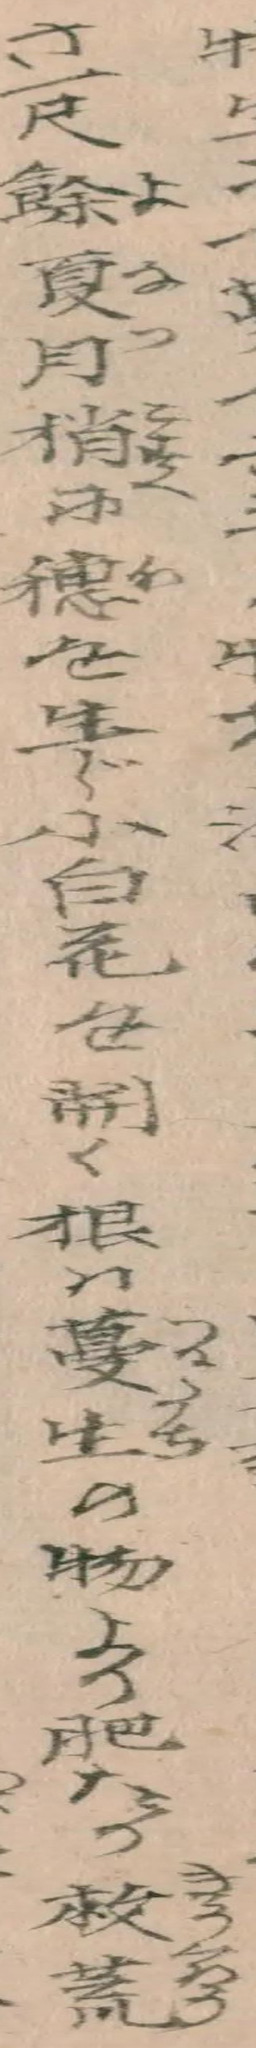さ一尺余夏月梢に穂を生じ小白花を開く根は蔓生の物より肥たり救荒
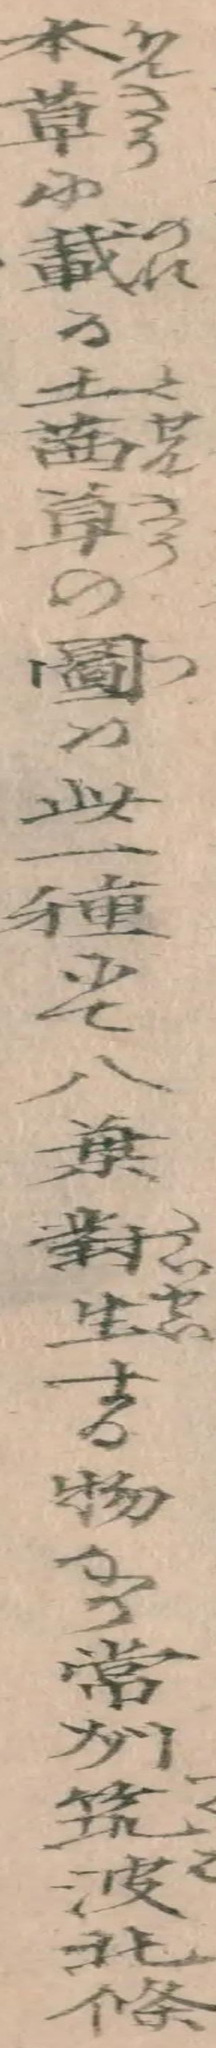本草に載る土茜草の図は此一種にて八葉対生する物なり常州筑波北条
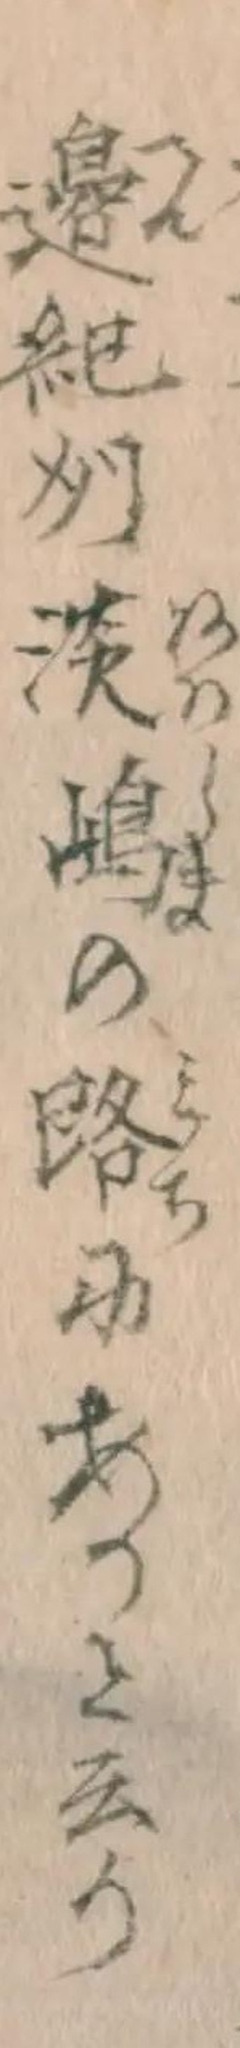辺紀州淡嶋の路にありと云り

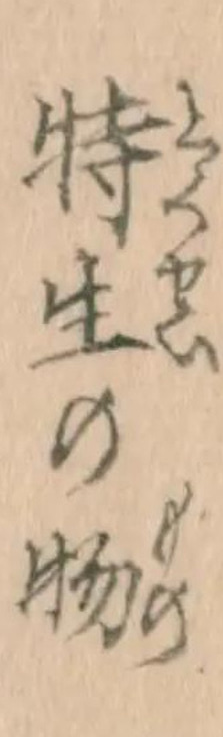特生の物
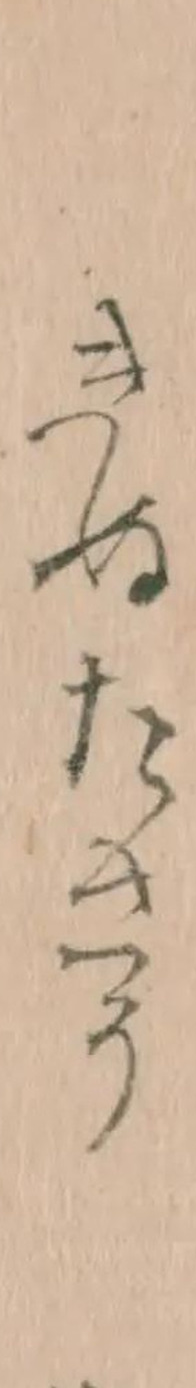きぬたさう
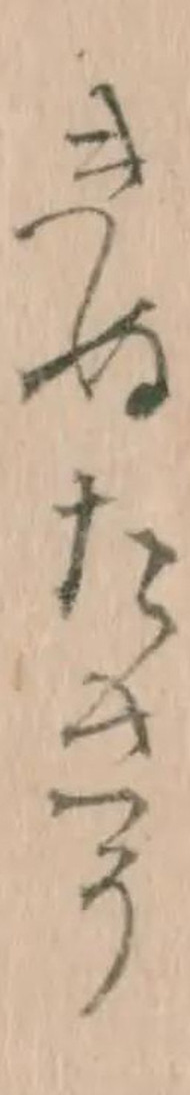きぬたさう
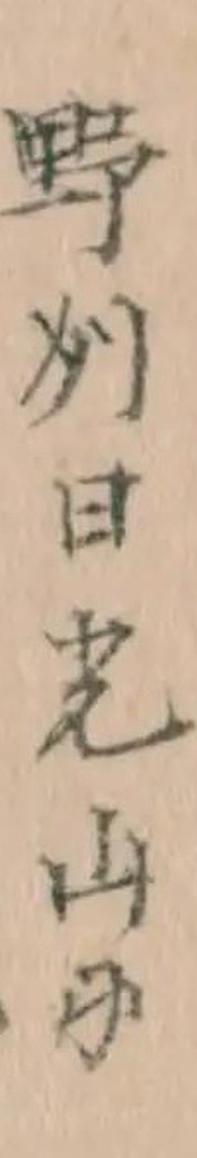野州日光山に
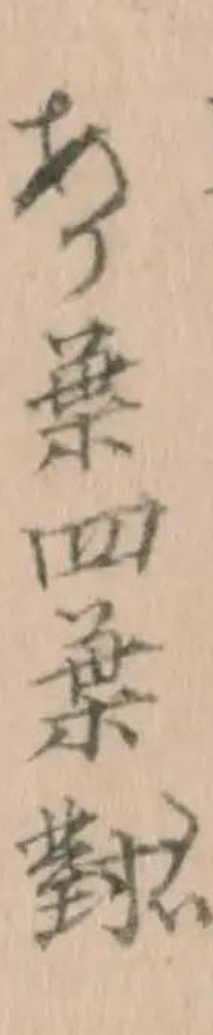あり葉四葉対
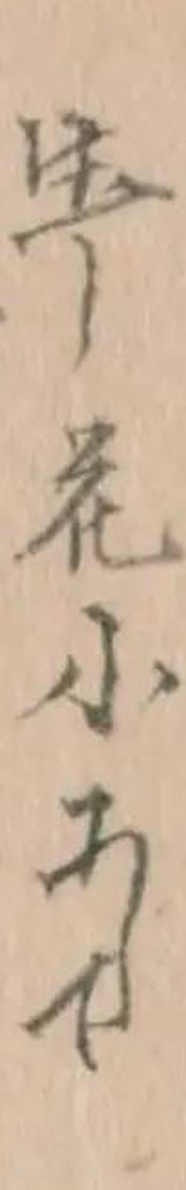生し花小にして
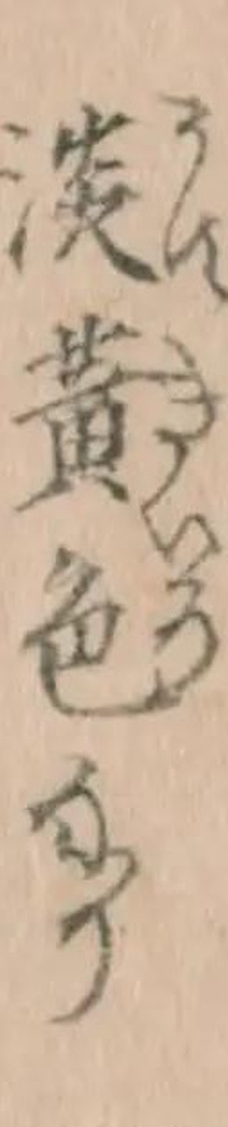淡黄色なり

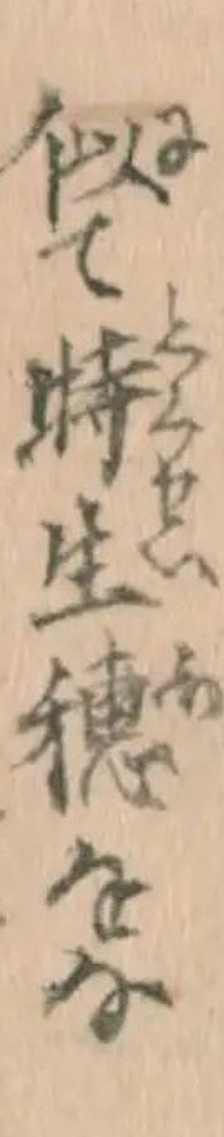似て特生穂をな
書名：本草図譜. 巻28-30
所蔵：国立国会図書館 National Diet Library, JAPAN
